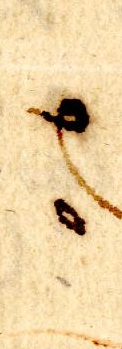To
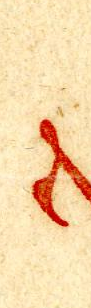2
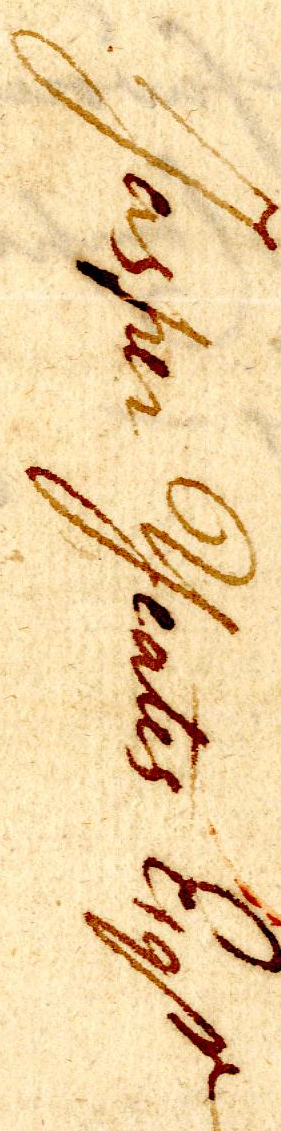Jasper Yeates Esq^r.
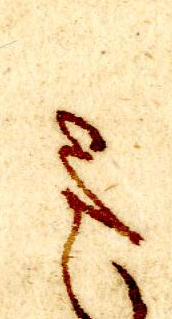at
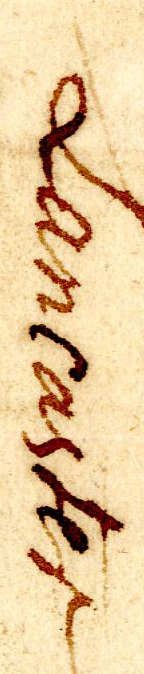Lancaster
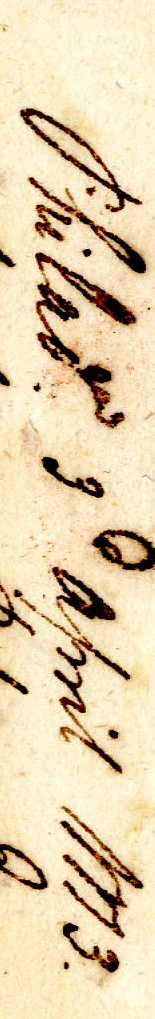Philad^a. 3^d April 1773.
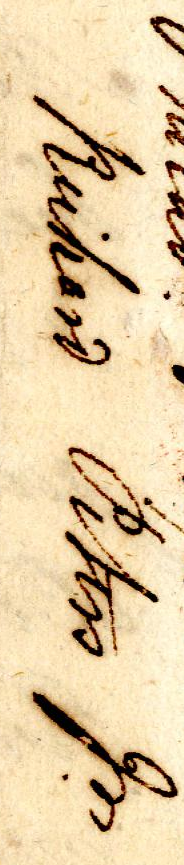Richard Peters Jr.
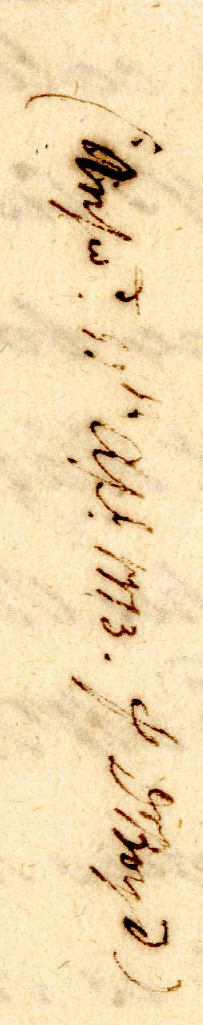(Answ^d. 13^th Apr^l. 1773 per D^r Boyd)
